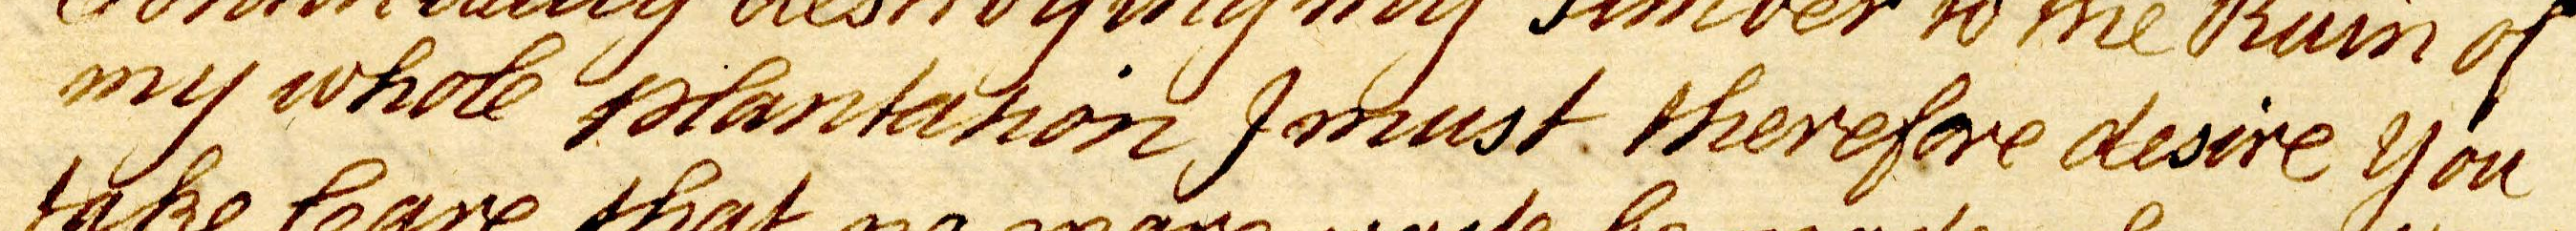my whole plantation I must therefore desire You
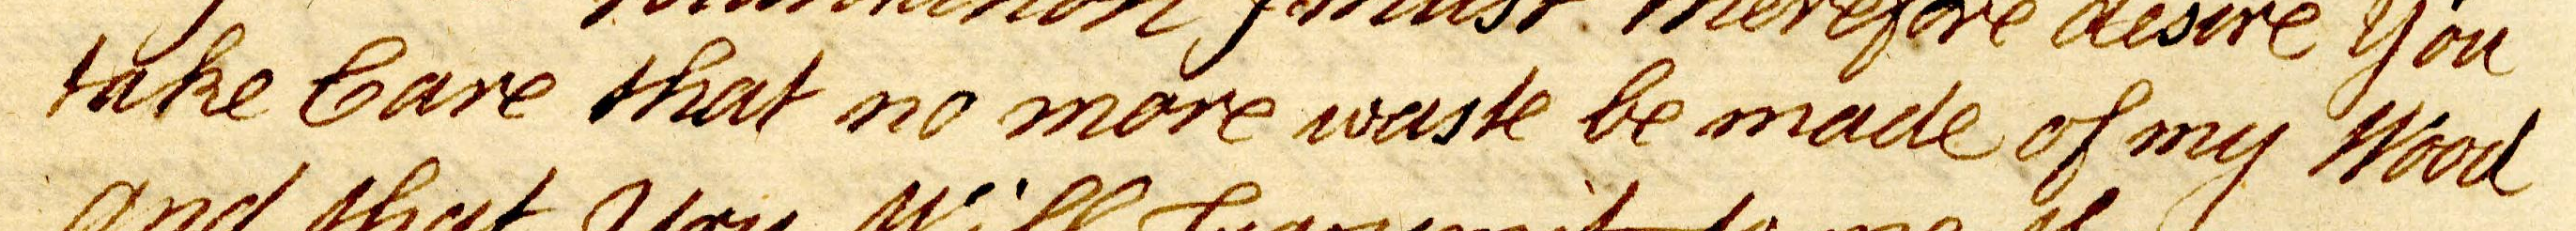take Care that no more waste be made of my Wood
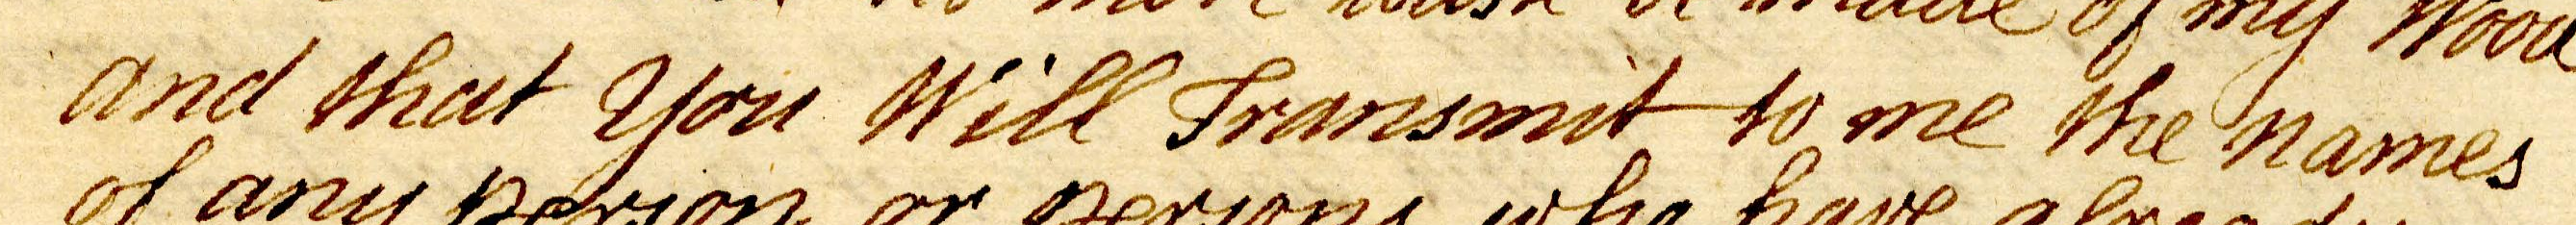and that You Will Transmit to me the Names
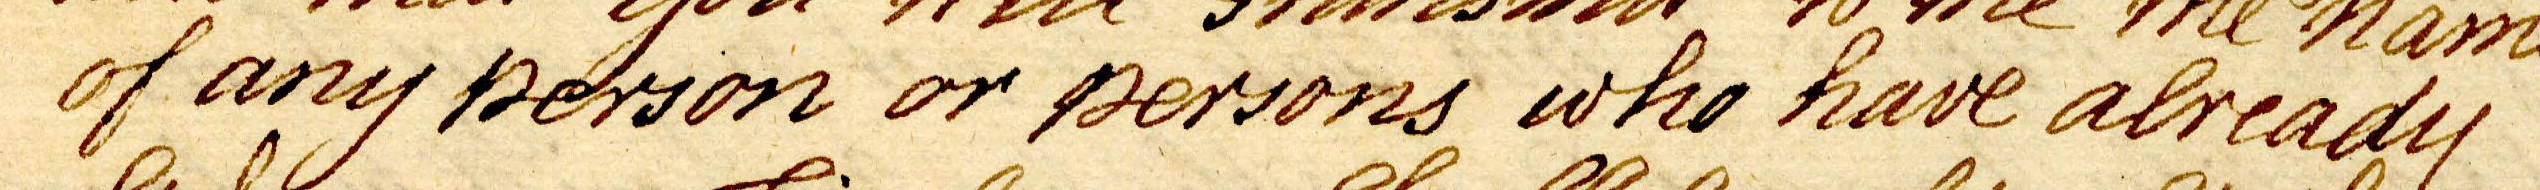of any person or persons who have already
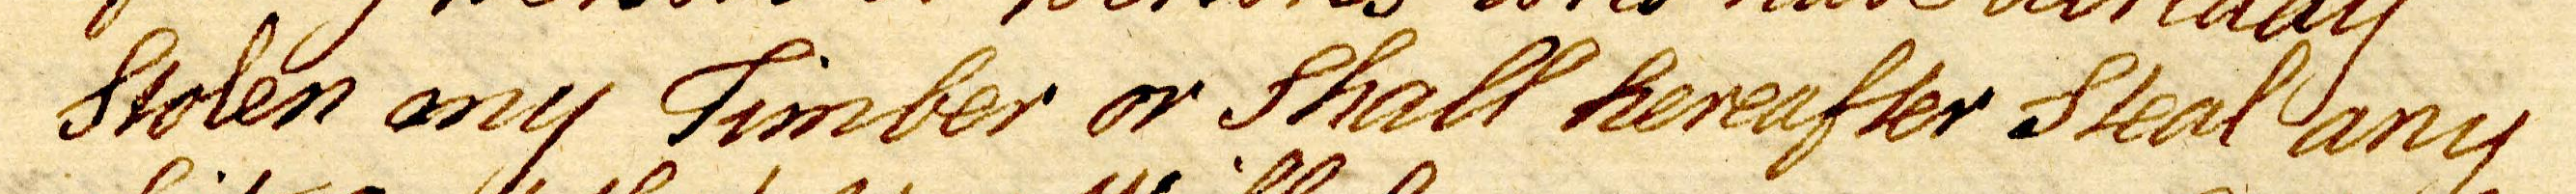Stolen my Timber or Shall hereafter Steal any
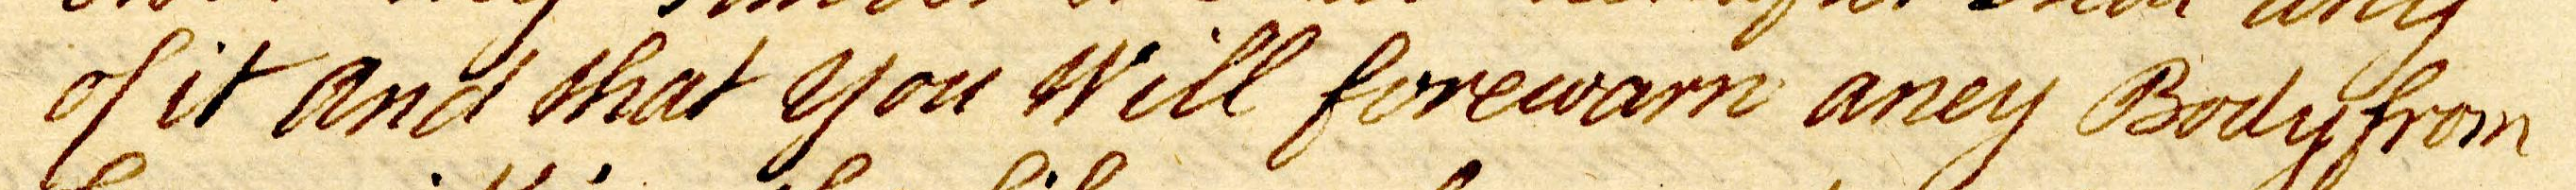of it And that You Will forewarn aney Body from
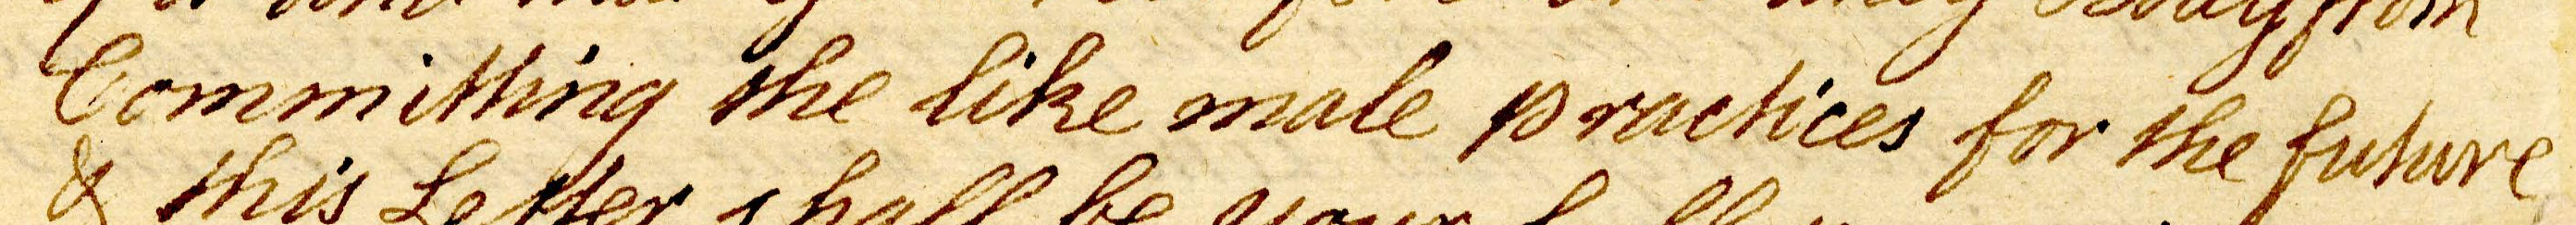Committing the like male practices for the future
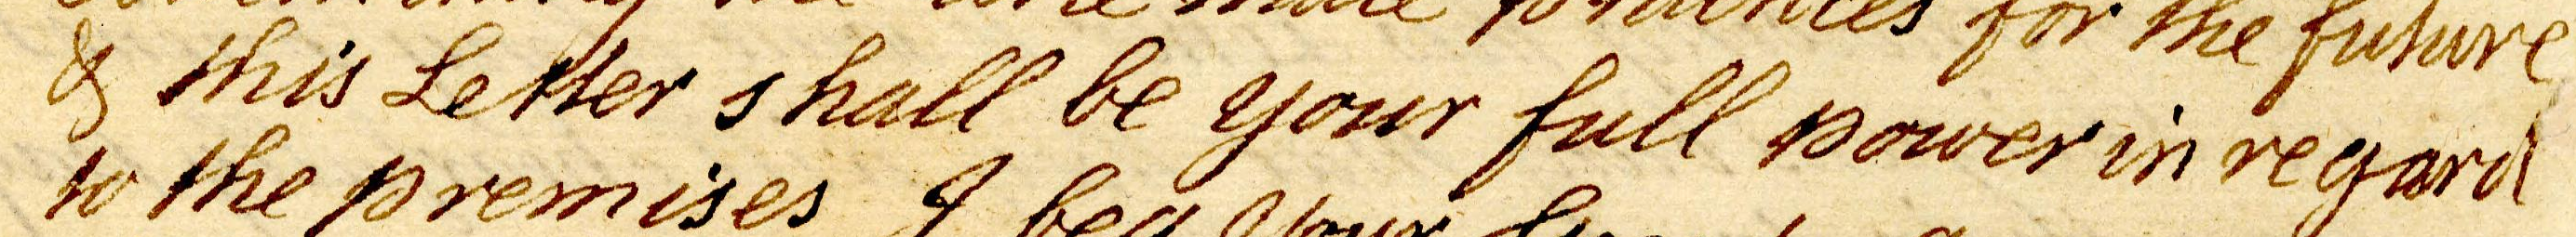& this Letter shall be Your full power in regard
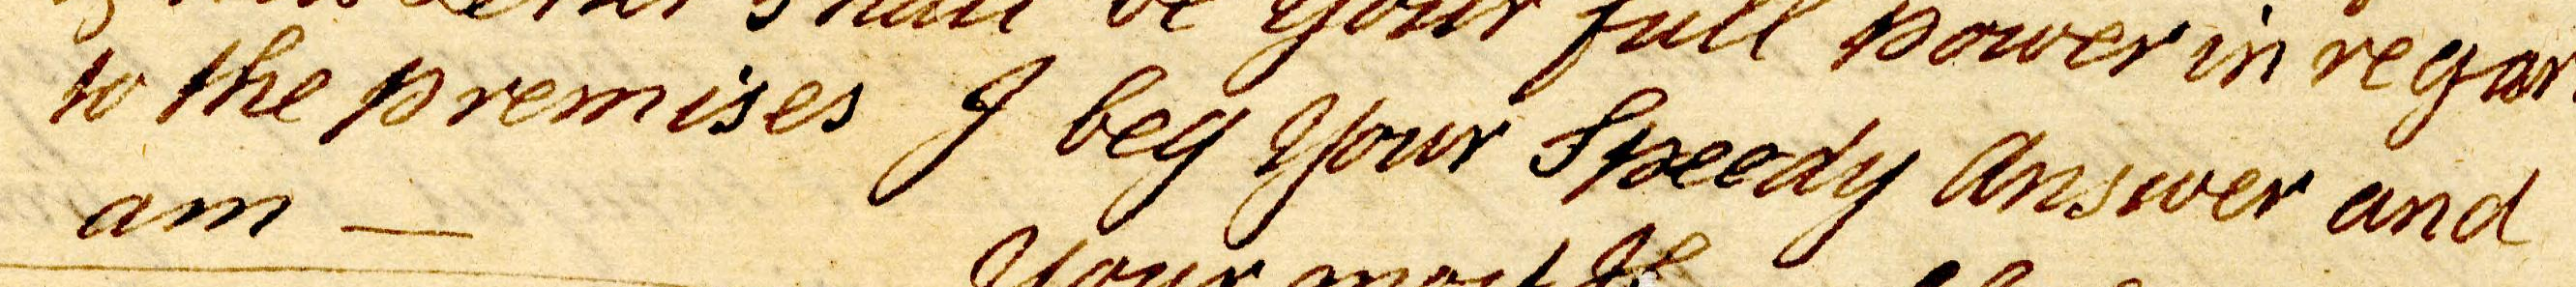to the premises I beg Your Speedy Answer and
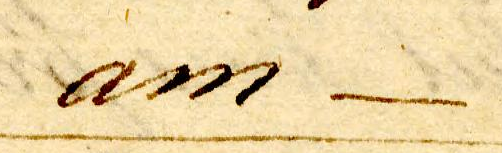am-
